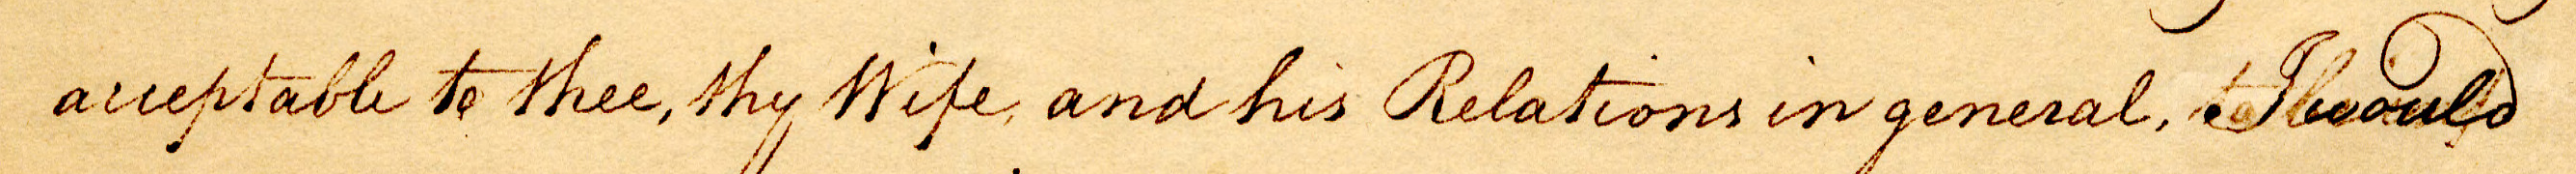acceptable to thee, thy Wife, and his Relations in general, I would
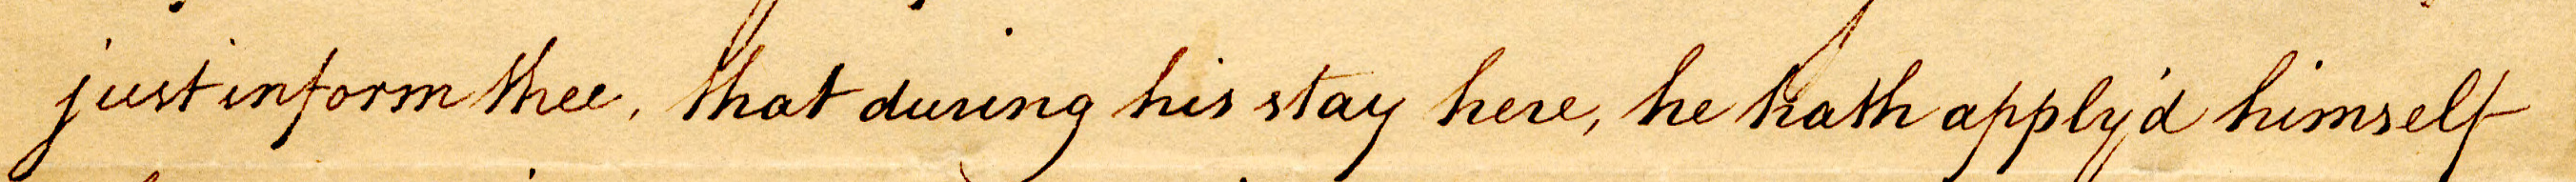just inform thee, that during his stay here, he hath apply'd himself
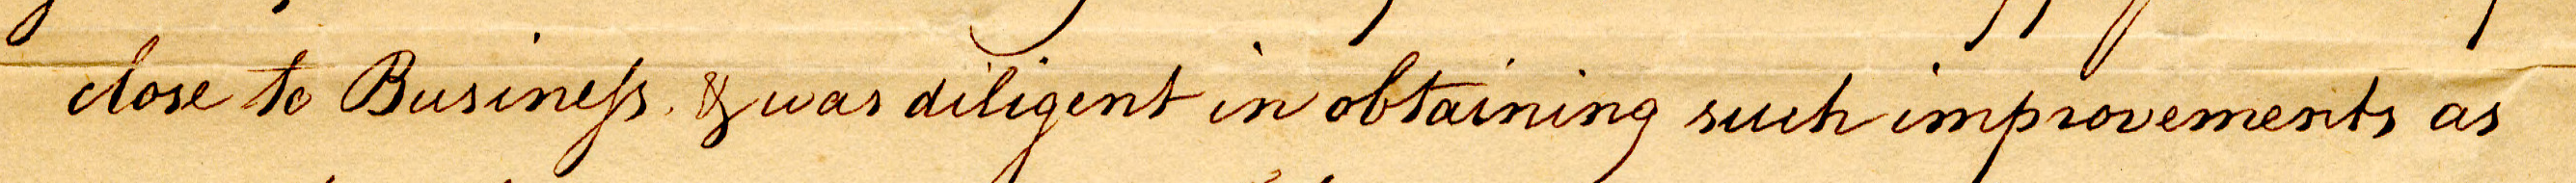close to Business, & was diligent in obtaining such improvements as
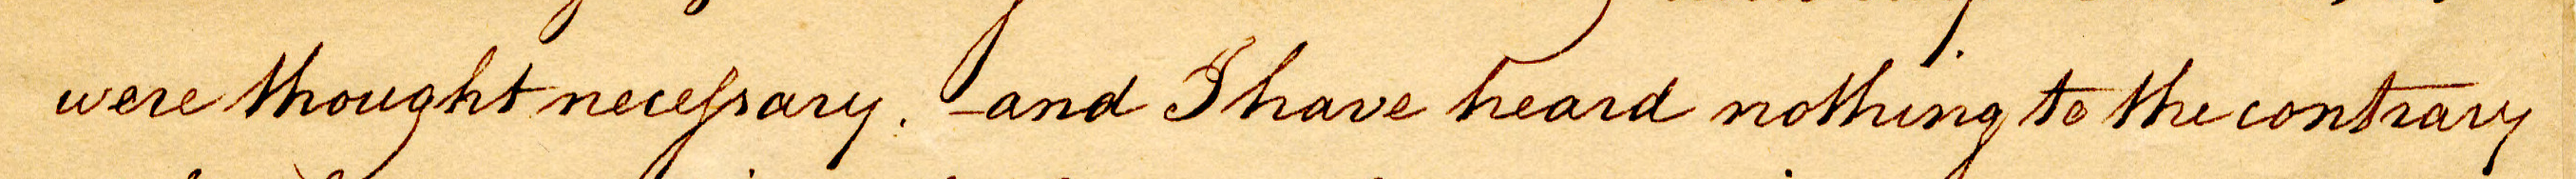were thought necessary. and I have heard nothing to the contrary
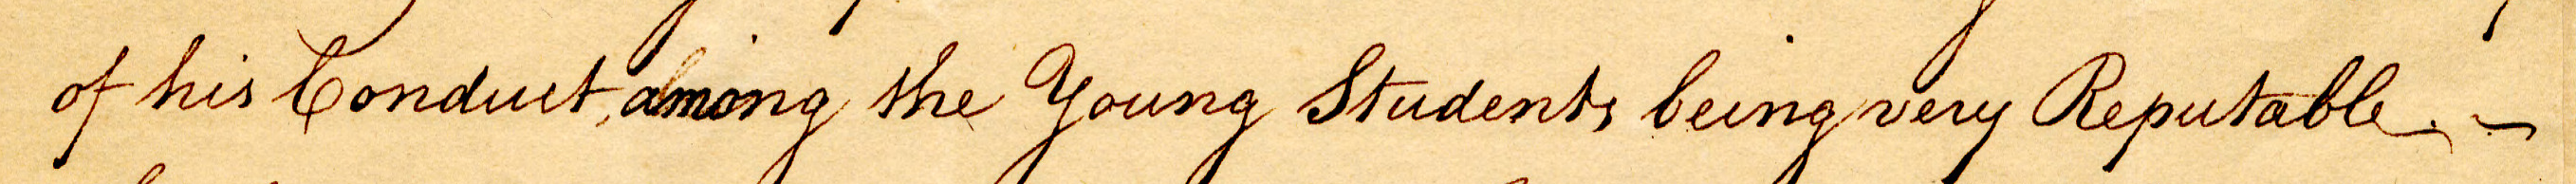of his Conduct among the Young Students being very Reputable-
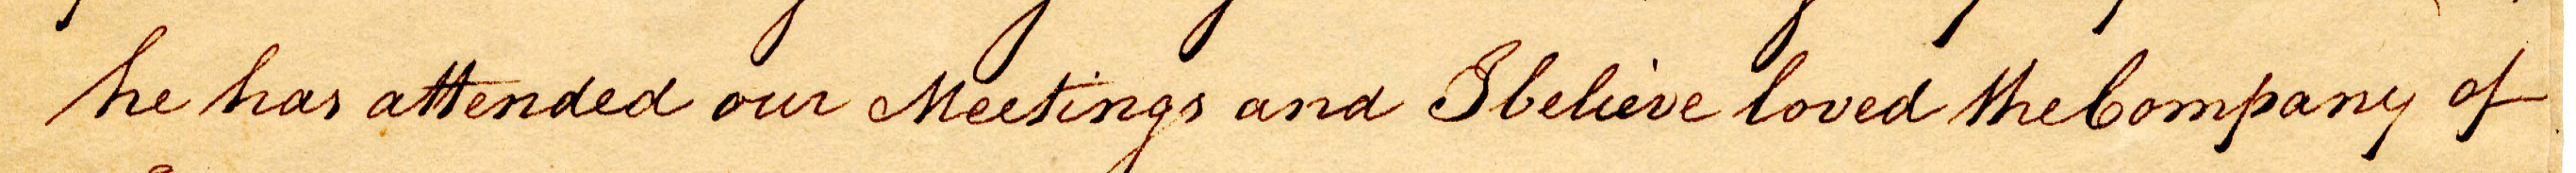he has attended our Meetings and I believe loved the Company of
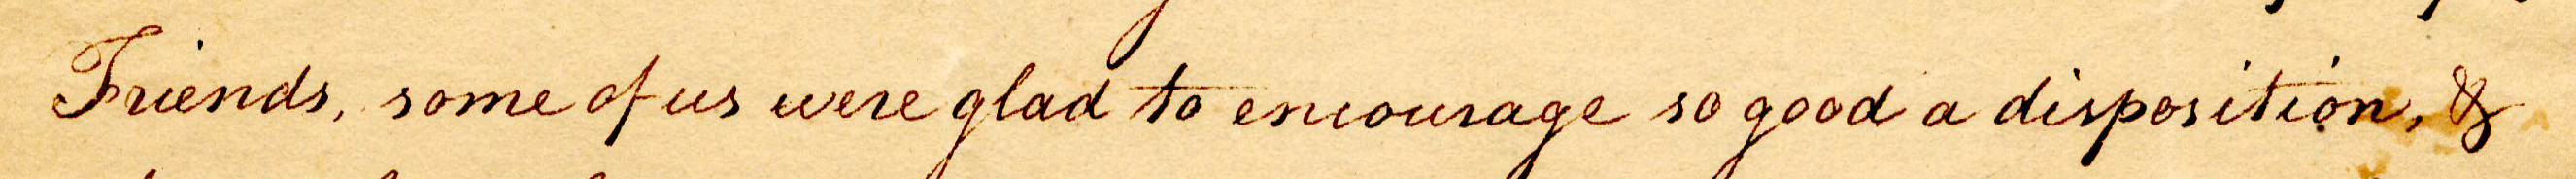Friends, some of us were glad to encourage so good a disposition, &
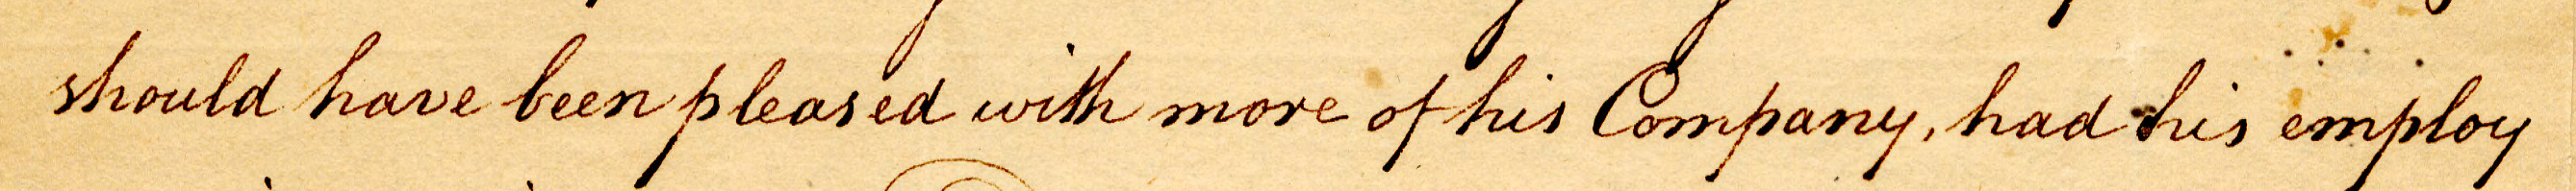should have been pleased with more of his Company, had his employ
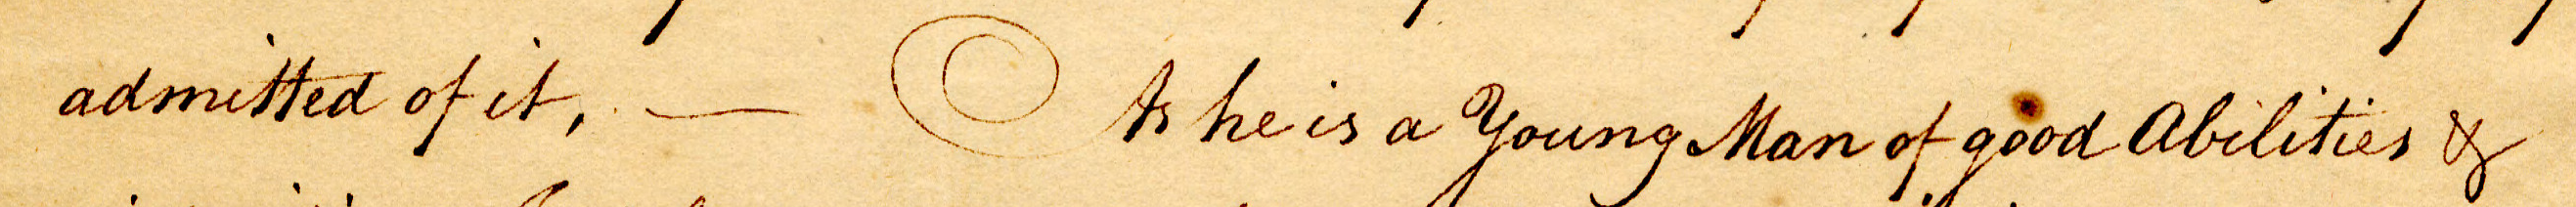admitted of it.- As he is a Young Man of good abilities &
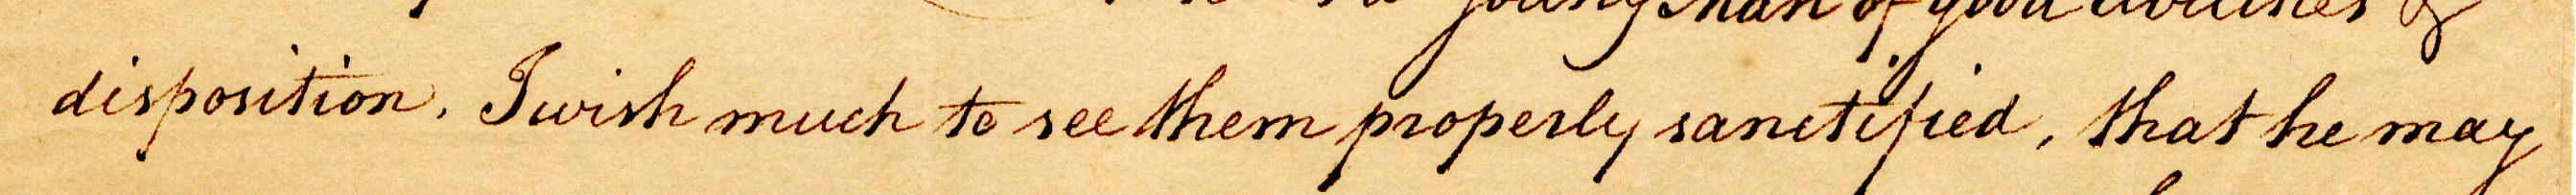disposition. I wish much to see them properly sanctified, that he may
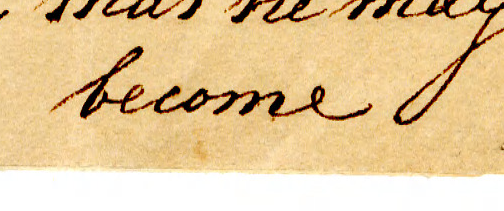become
